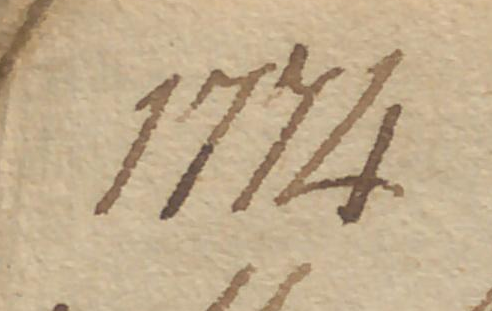1774
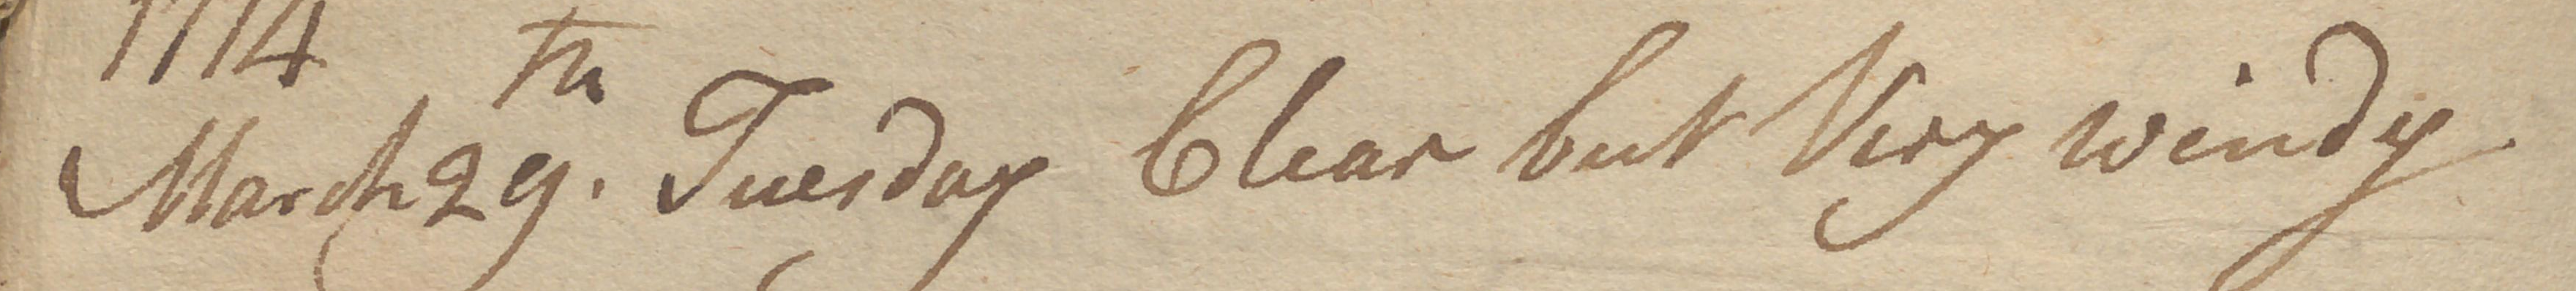March 29^th. Tuesday Clear but Very windy
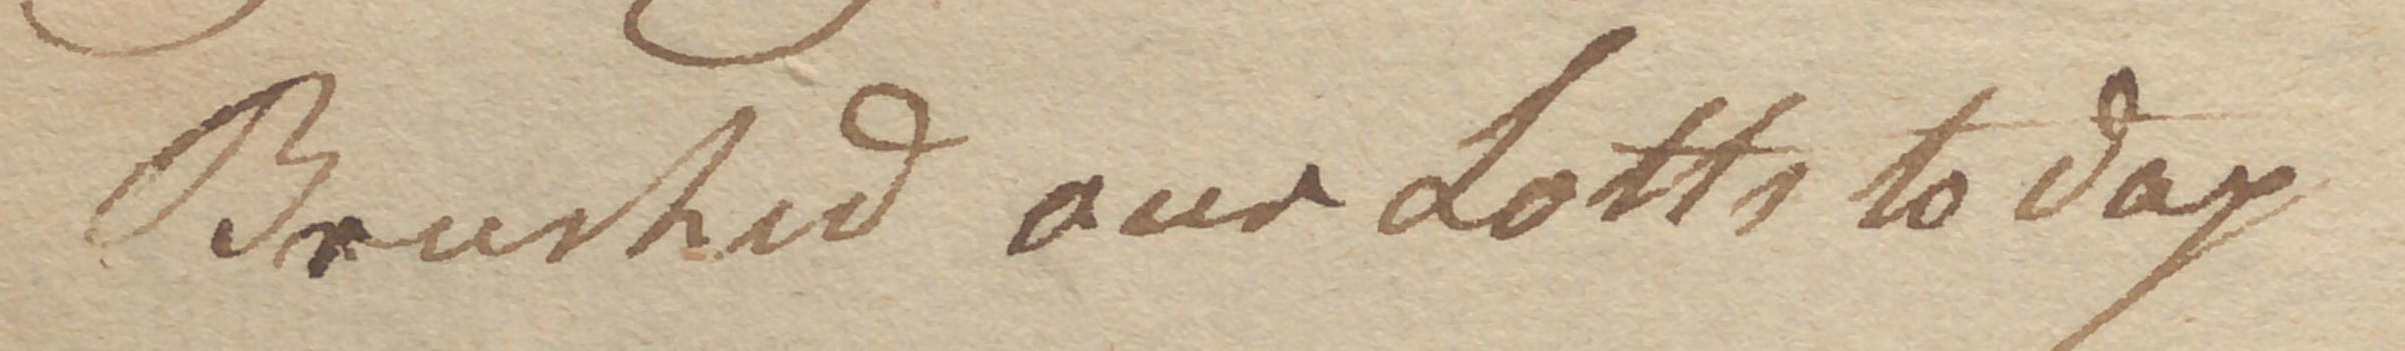Brushed our Lotts to day
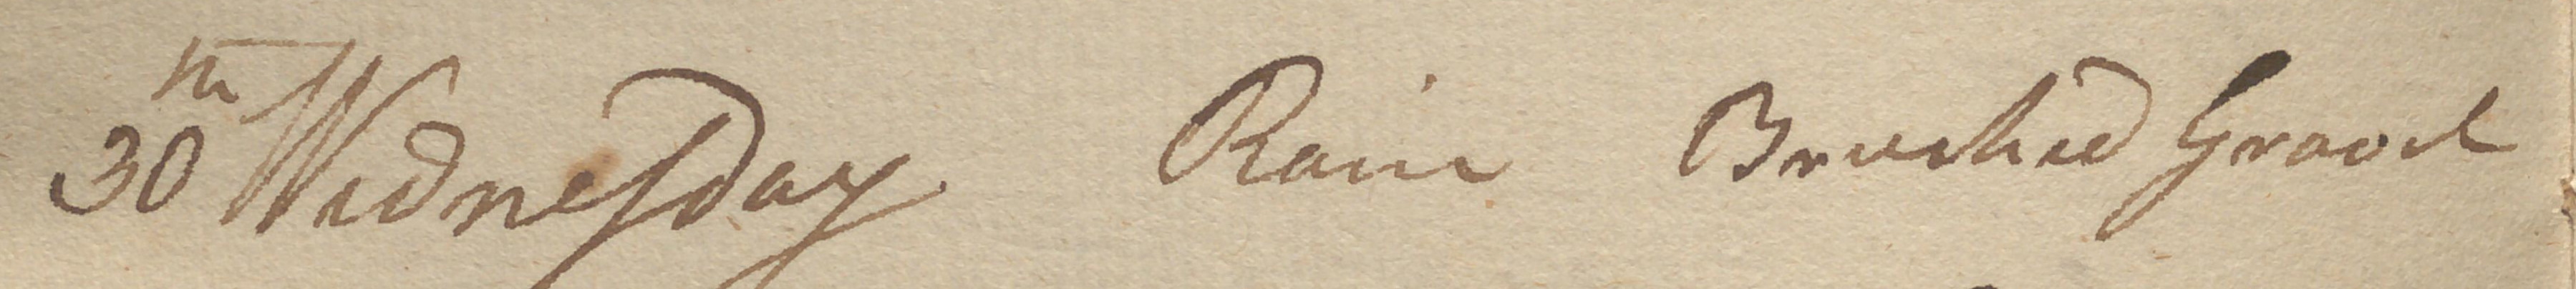30^th Wednesday, Rain Brushed Gravel
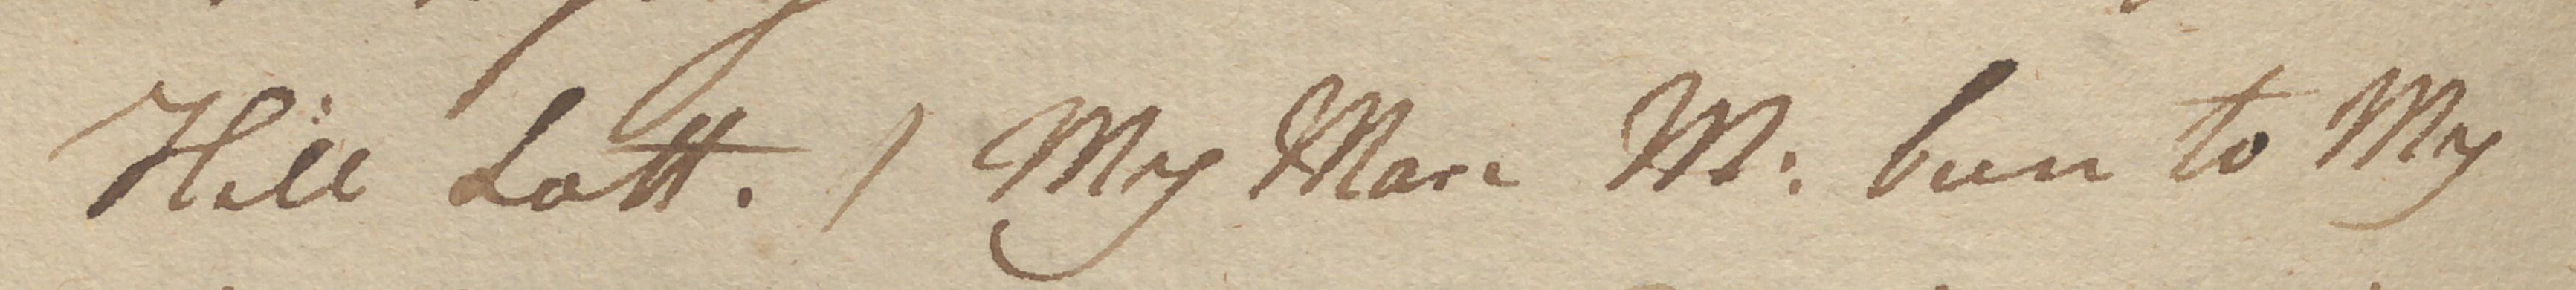Hill Lott. My Mare M. been to My
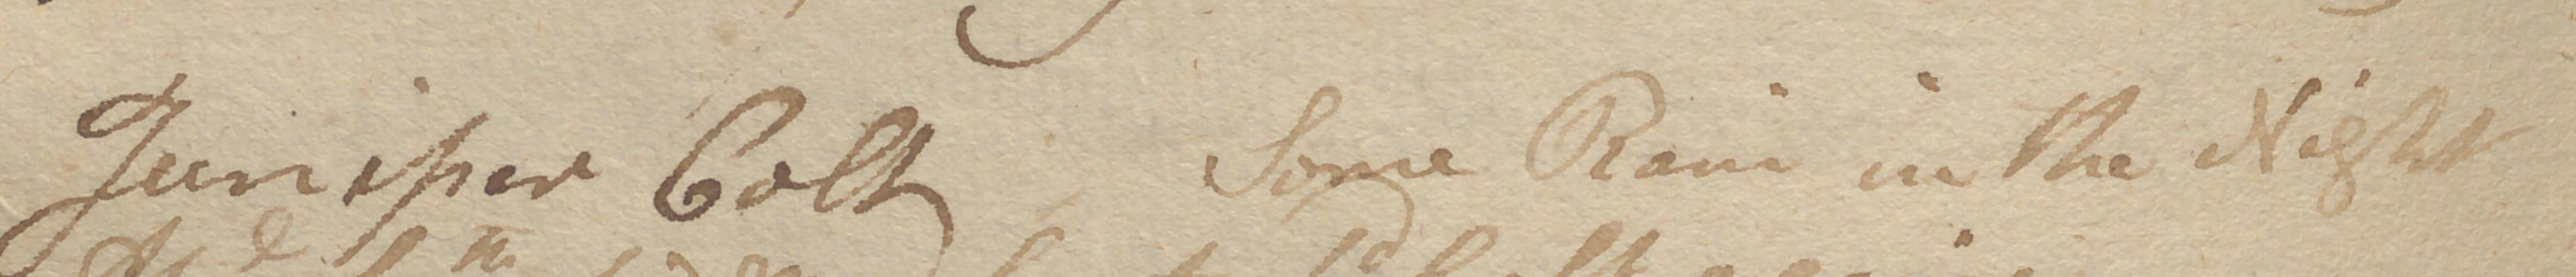Juniper Colt some Rain in the Night
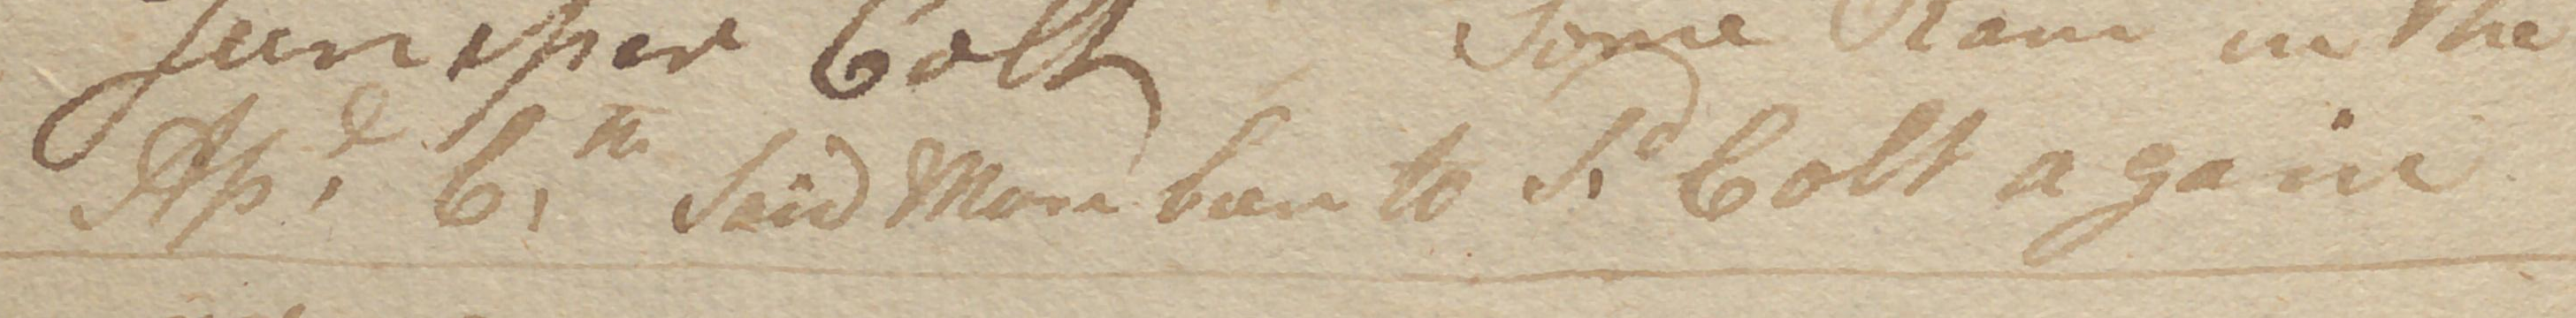Ap^l. 6^th. said Mare been to s^d. Colt again
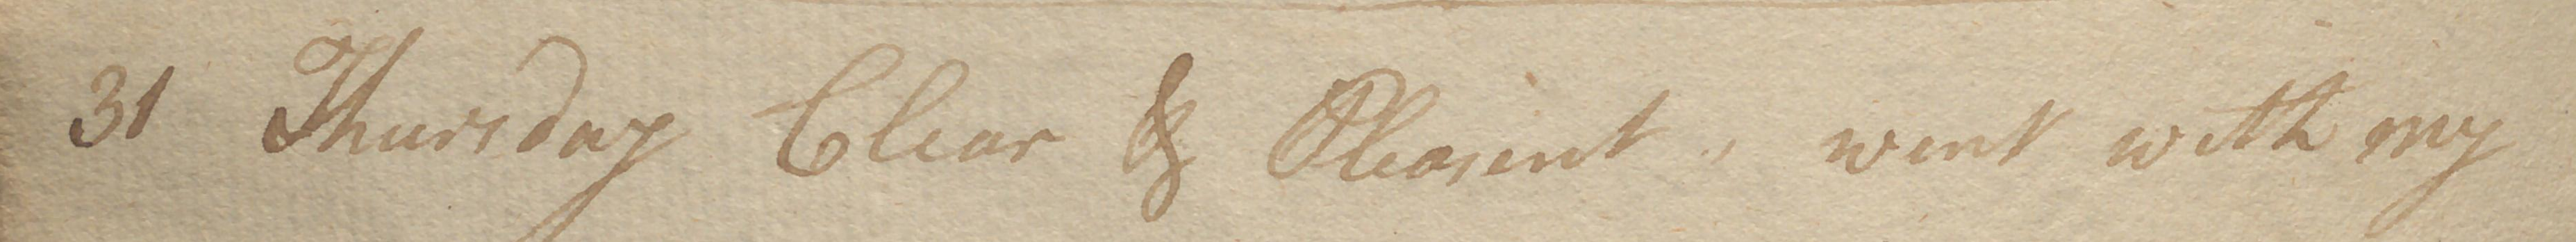31 Thursday Clear & Pleasent went with my
